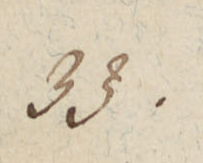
33.
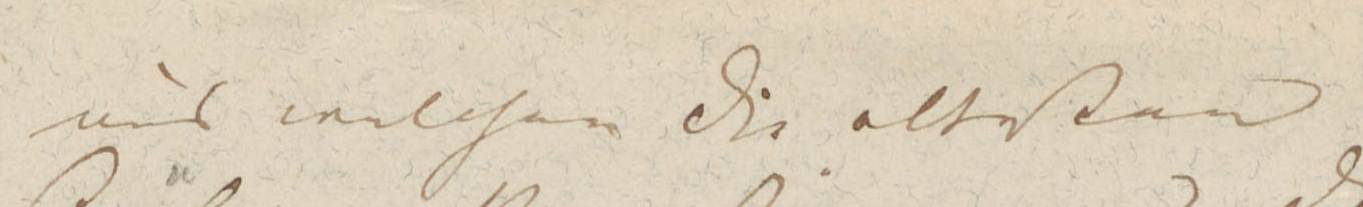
aus welchen die altesten
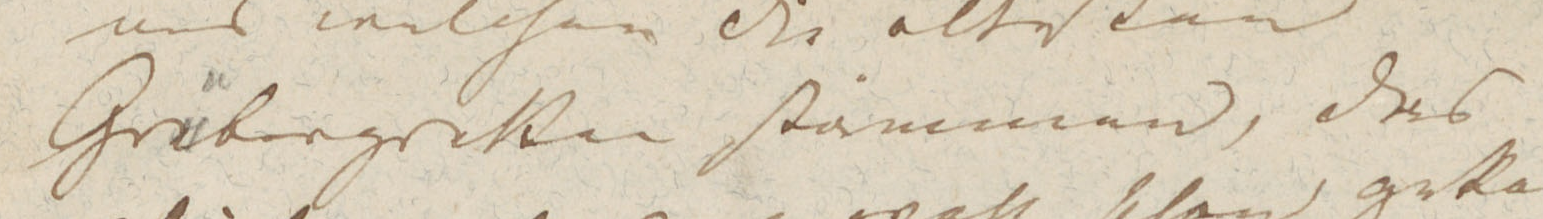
Graäbergrotten stammen, das
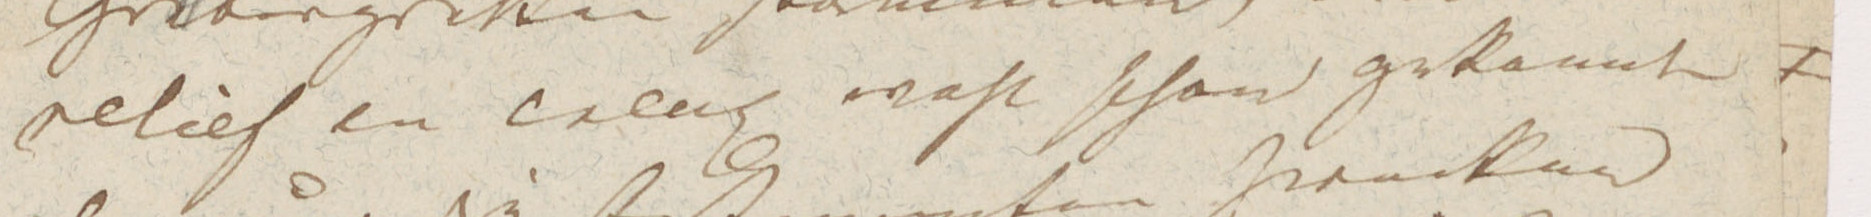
relief en creux wohl schon gekannt
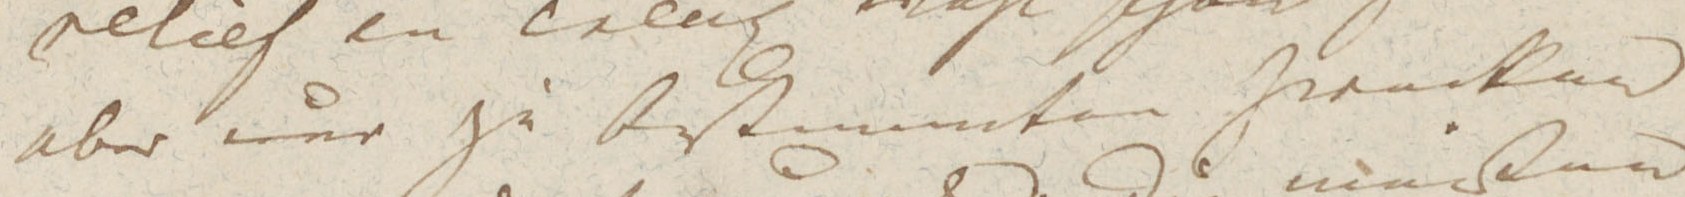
aber nur zu bestimmten Zwecken
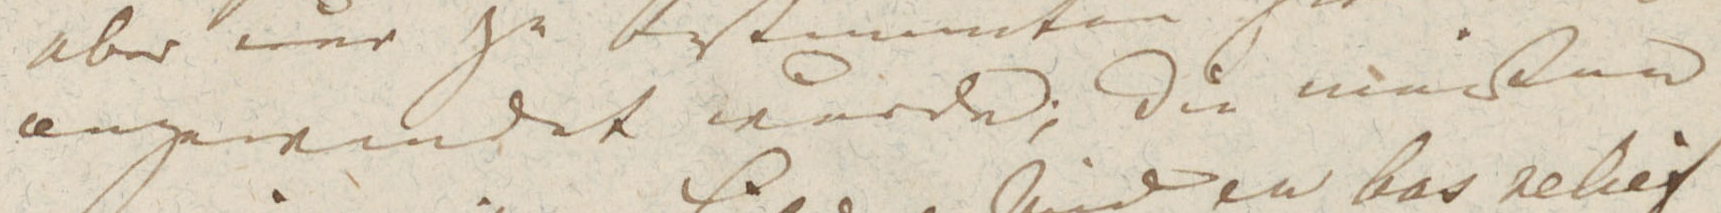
angewendet wurde; die meisten
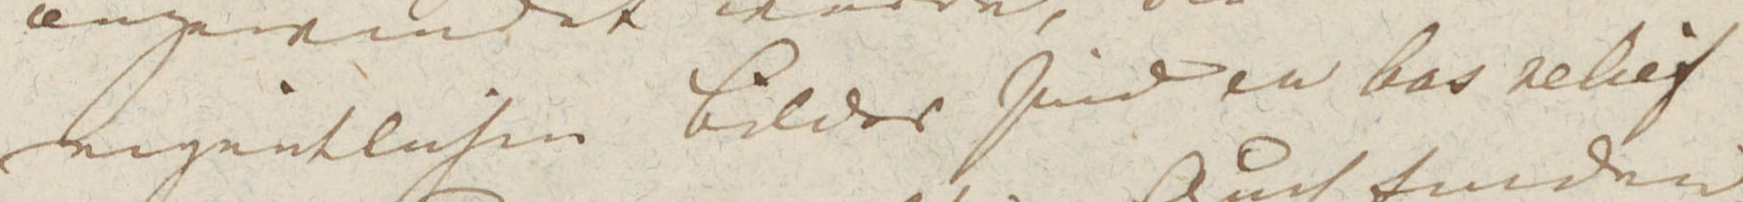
eigentlichen Bilder sind en bas relief
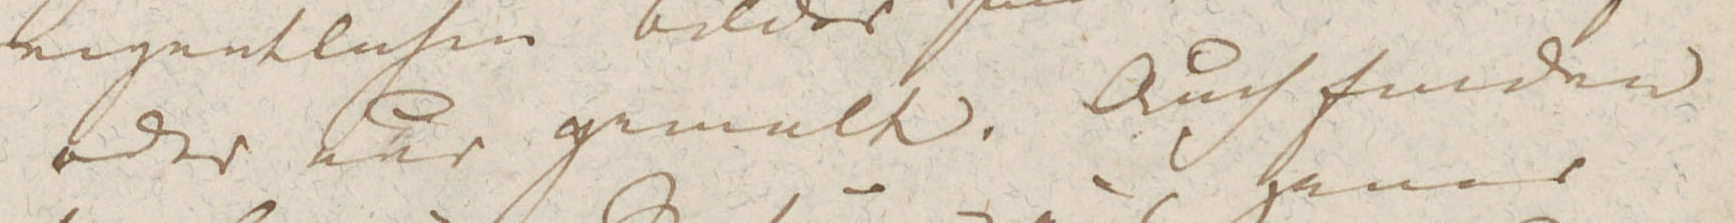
oder nur gemalt. Auch finden
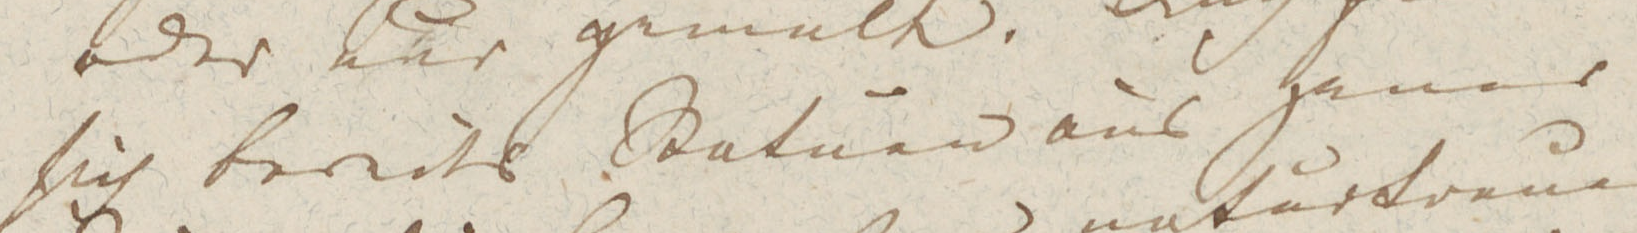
sich bereits Statuen aus jener
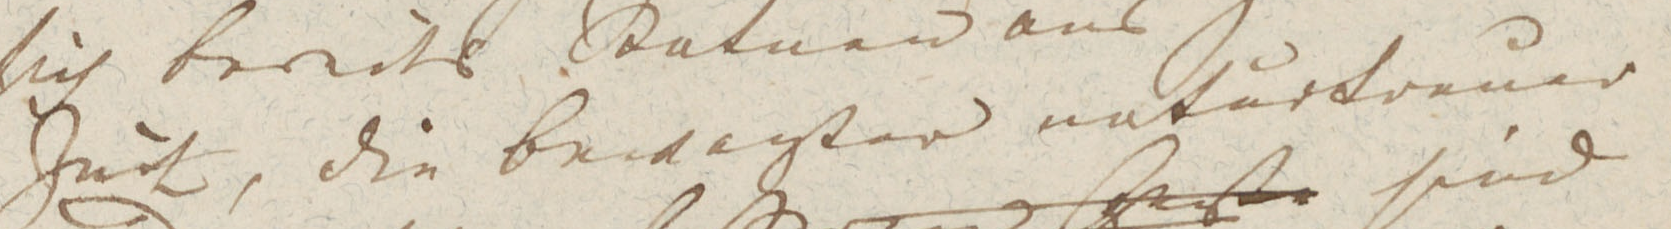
Zeit, die bewegter naturtreuer
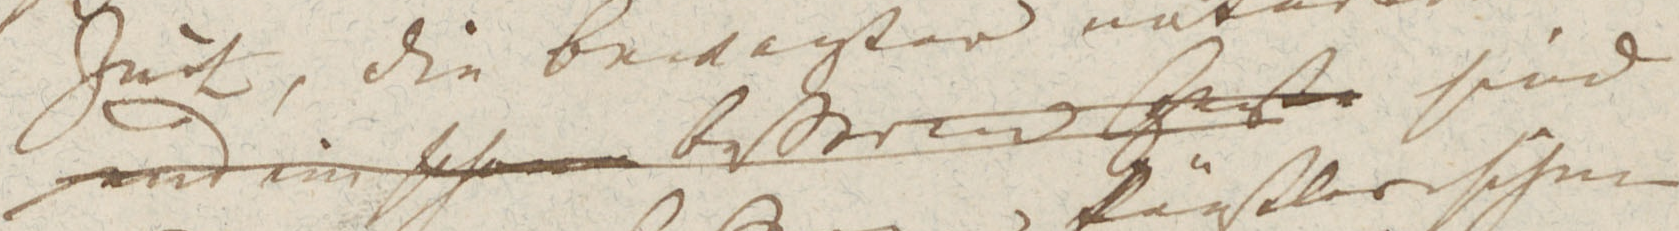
und im schone besseren Geiste sind
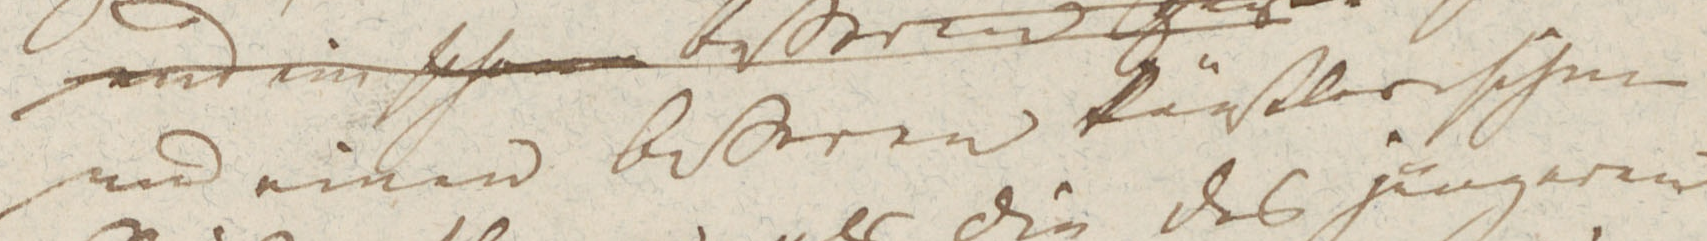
und einen besseren künstlerischen
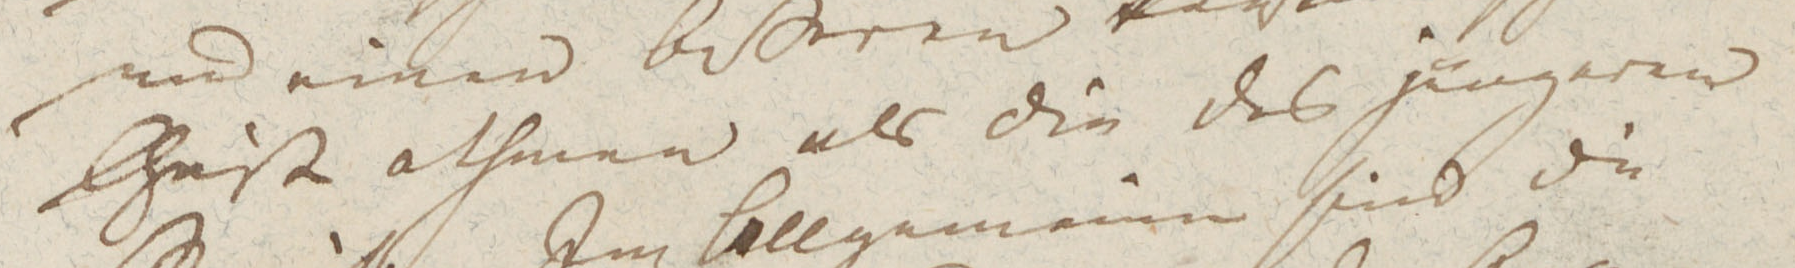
Geist athmen als die des jüngeren
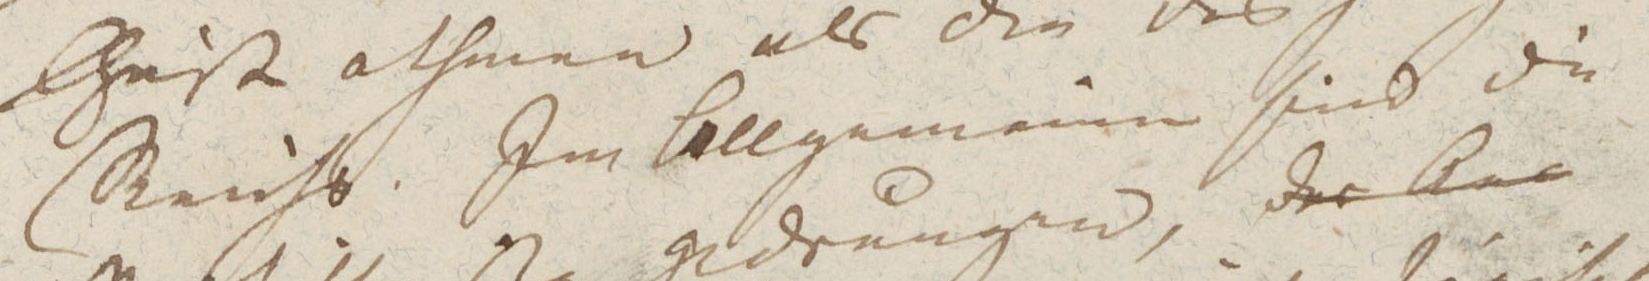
Reichs. Im Allgemeinen sind die
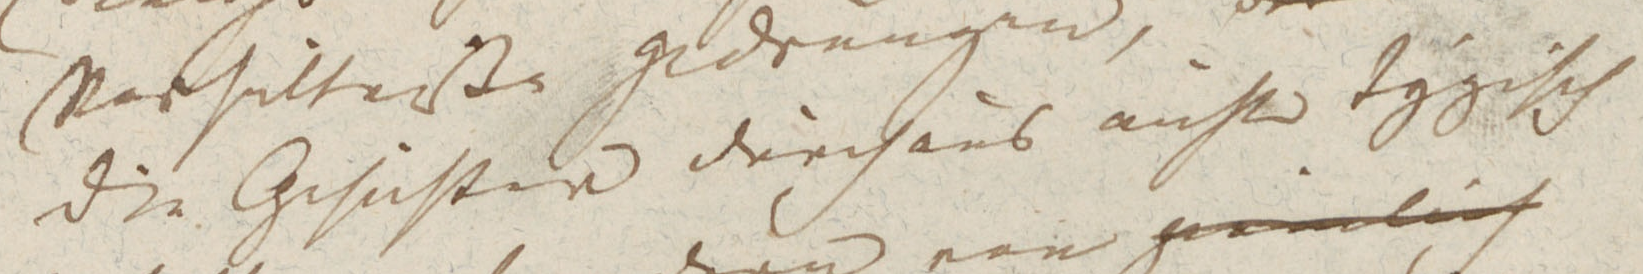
die Gesichter durchaus nicht typisch
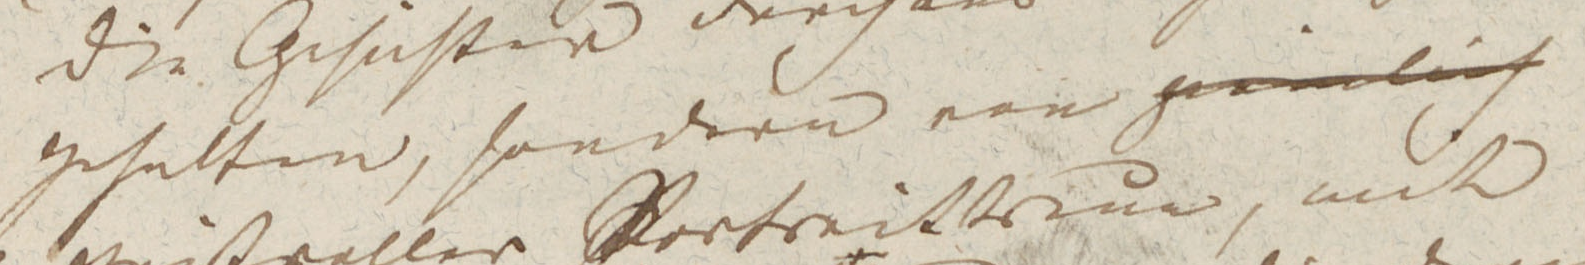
gehalten, sondern von ziemlich
